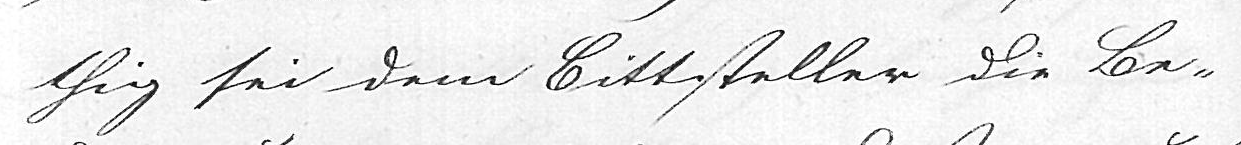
thig sei dem Bittsteller die Be-
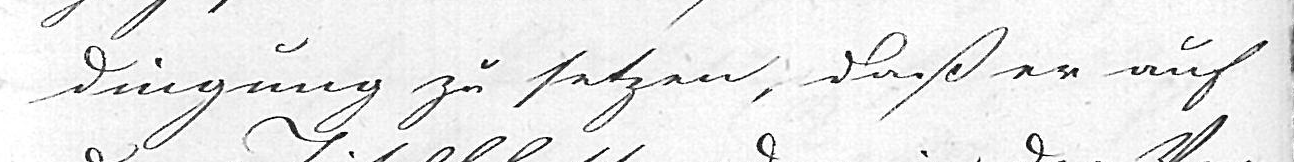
dingung zu setzen, daß er auf
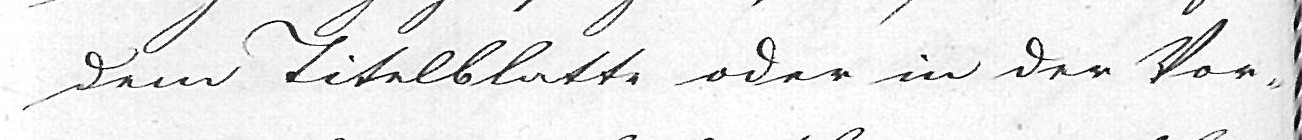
dem Titelblatte oder in der Vor-
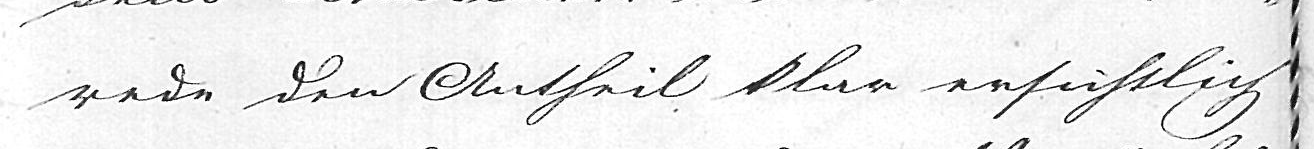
rede den Antheil klar ersichtlich
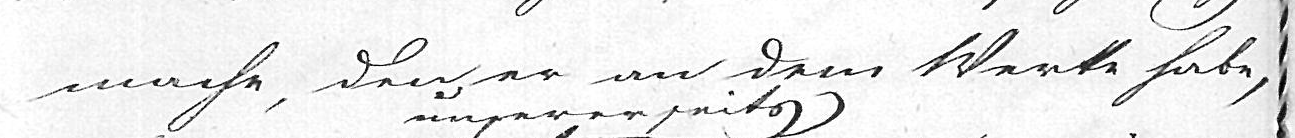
mache, den er an dem Werke habe;
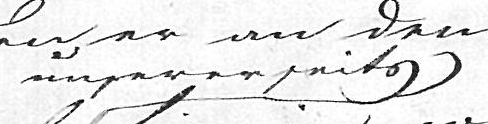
unsererseits
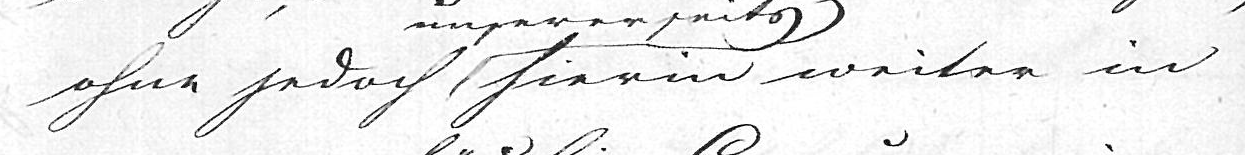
ohne jedoch hierin weiter in
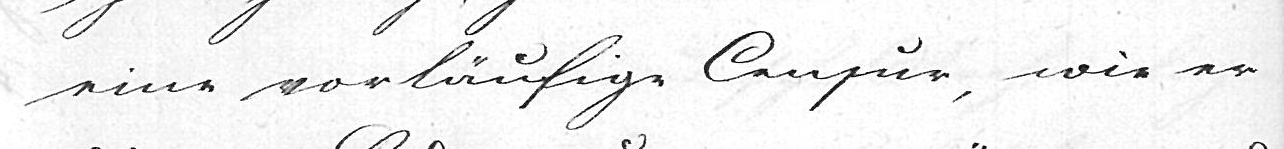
eine vorläufige Censur, wie er
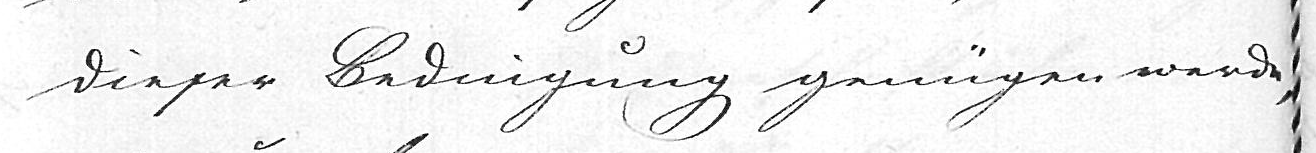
dieser Bedingung genügen werde,
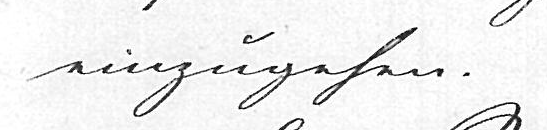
einzugehen.
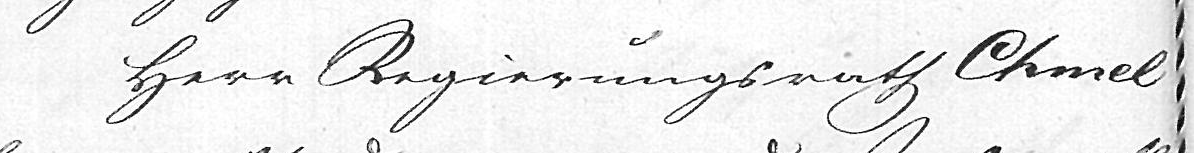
Herr Regierungsrath Chmel
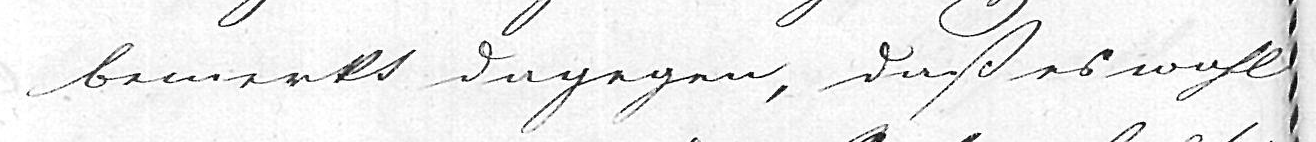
bemerkt dagegen, daß es wohl
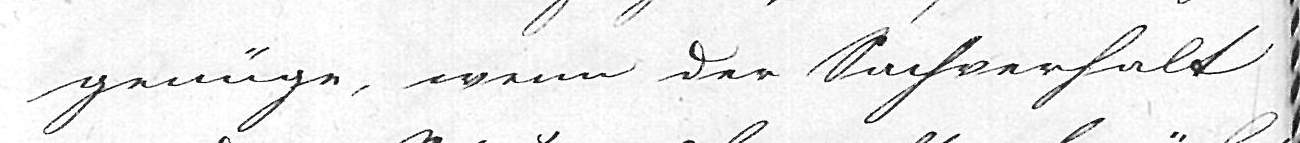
genüge, wenn der Sachverhalt
